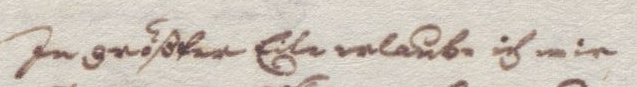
In größter Eile erlaube ich mir
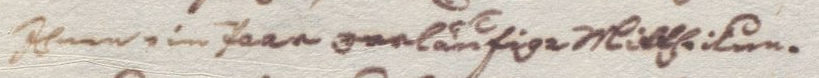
Ihnen ein Paar vorläufige Mittheilun-
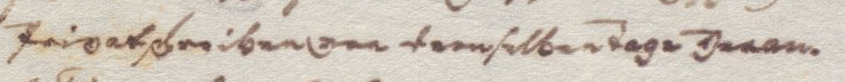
Privatschreiben von demselben Tage Veran-
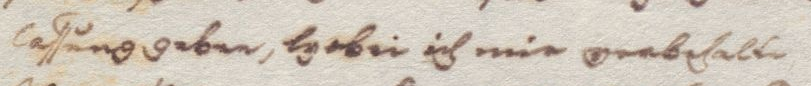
lassung geben, wobei ich mir vorbehalte,
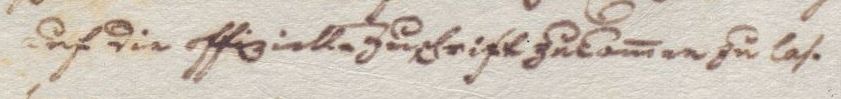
auf die offizielle Zuschrift zukommen zu las-
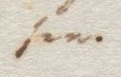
sen.
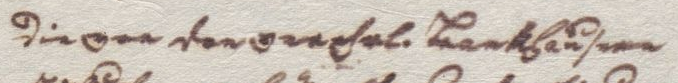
Die von den verehrl. Bankhäusern
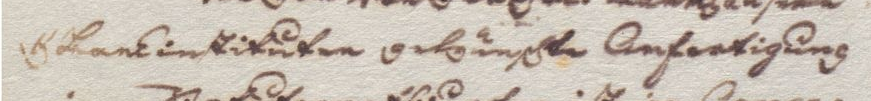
& Bankinstituten gewünschte Anfertigung
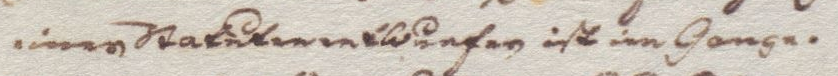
eines Statutenentwurfes ist im Gange.
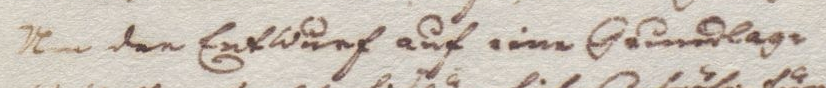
Um den Entwurf auf eine Grundlage
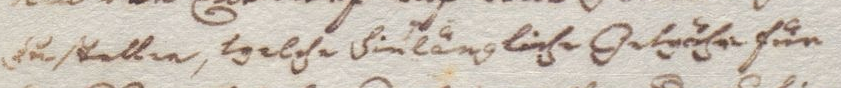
zu stellen, welche hinlängliche Gewähr für
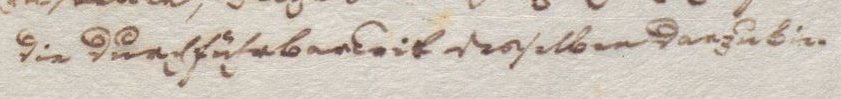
die Durchführbarkeit desselben darzubie-
